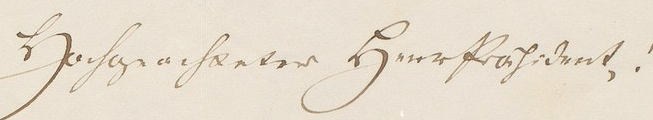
Hochgeachteter Herr Präsident!
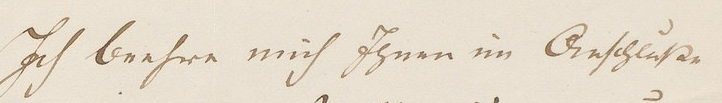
Ich beehre mich Ihnen im Anschluße
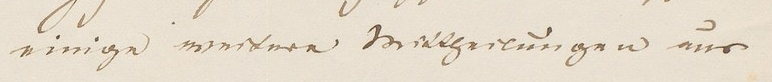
einige weitere Mittheilungen aus
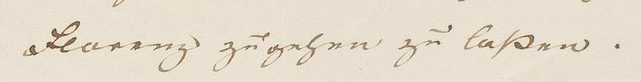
Florenz zugehen zu laßen.
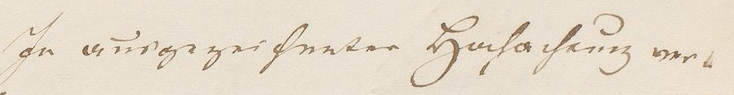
In ausgezeichneter Hochachtung ver-
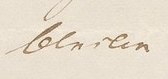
bleibe
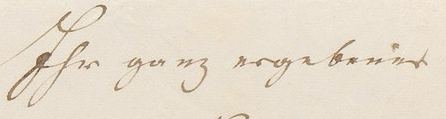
Ihr ganz ergebener
